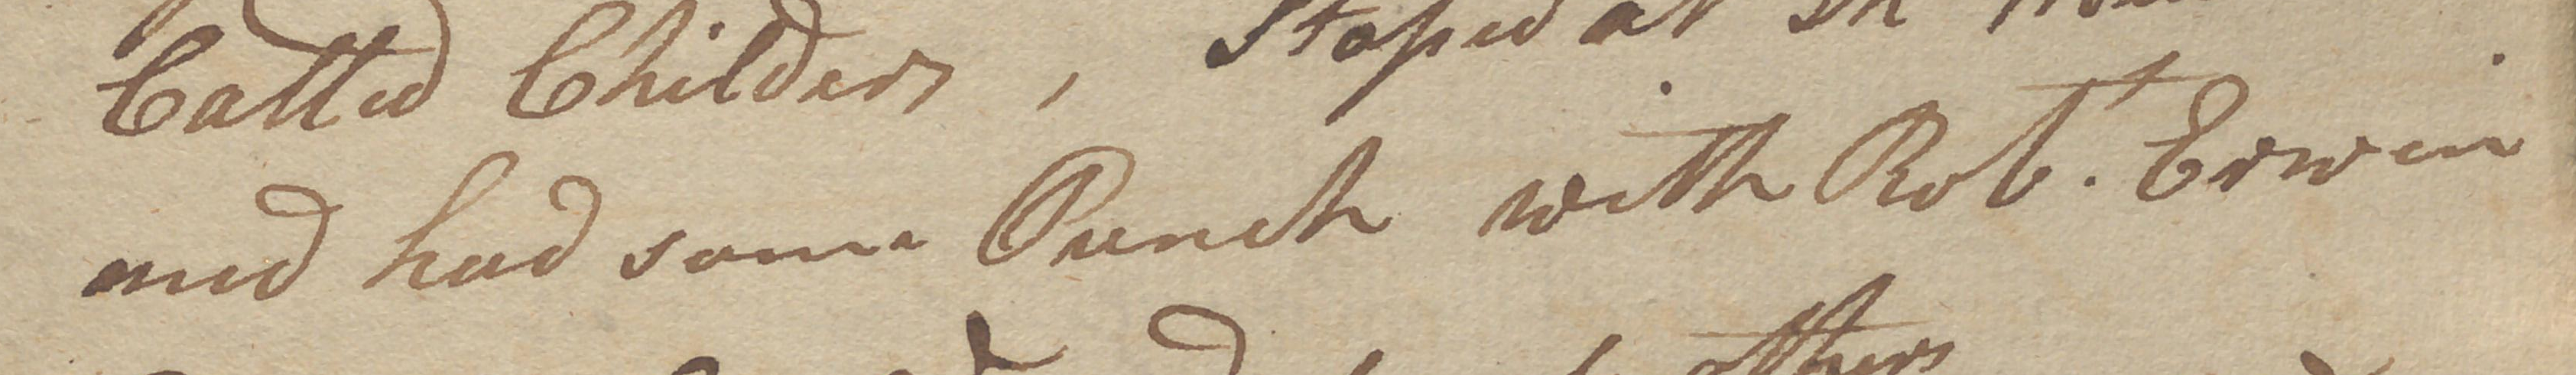and had some Punch with Rob^t. Erwin
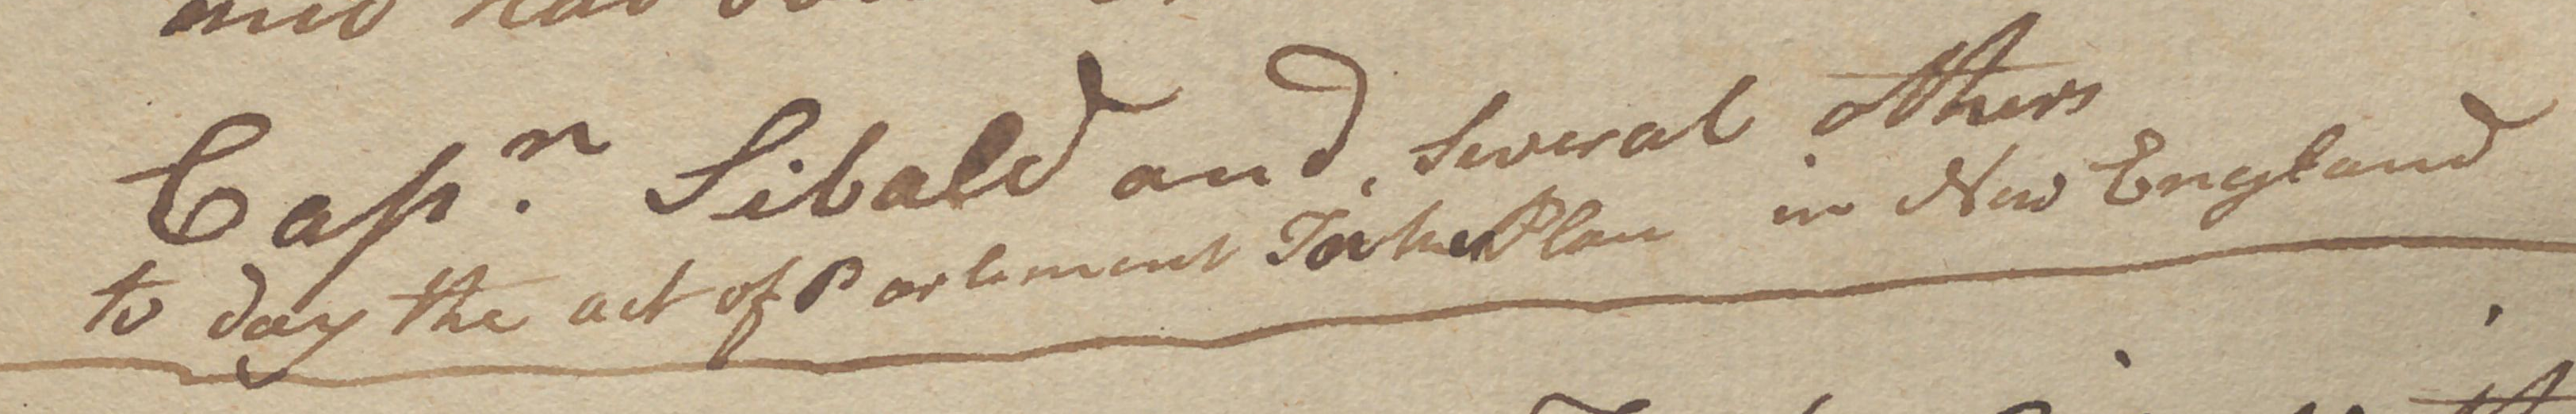to day the act of Parlement Took Place in New England
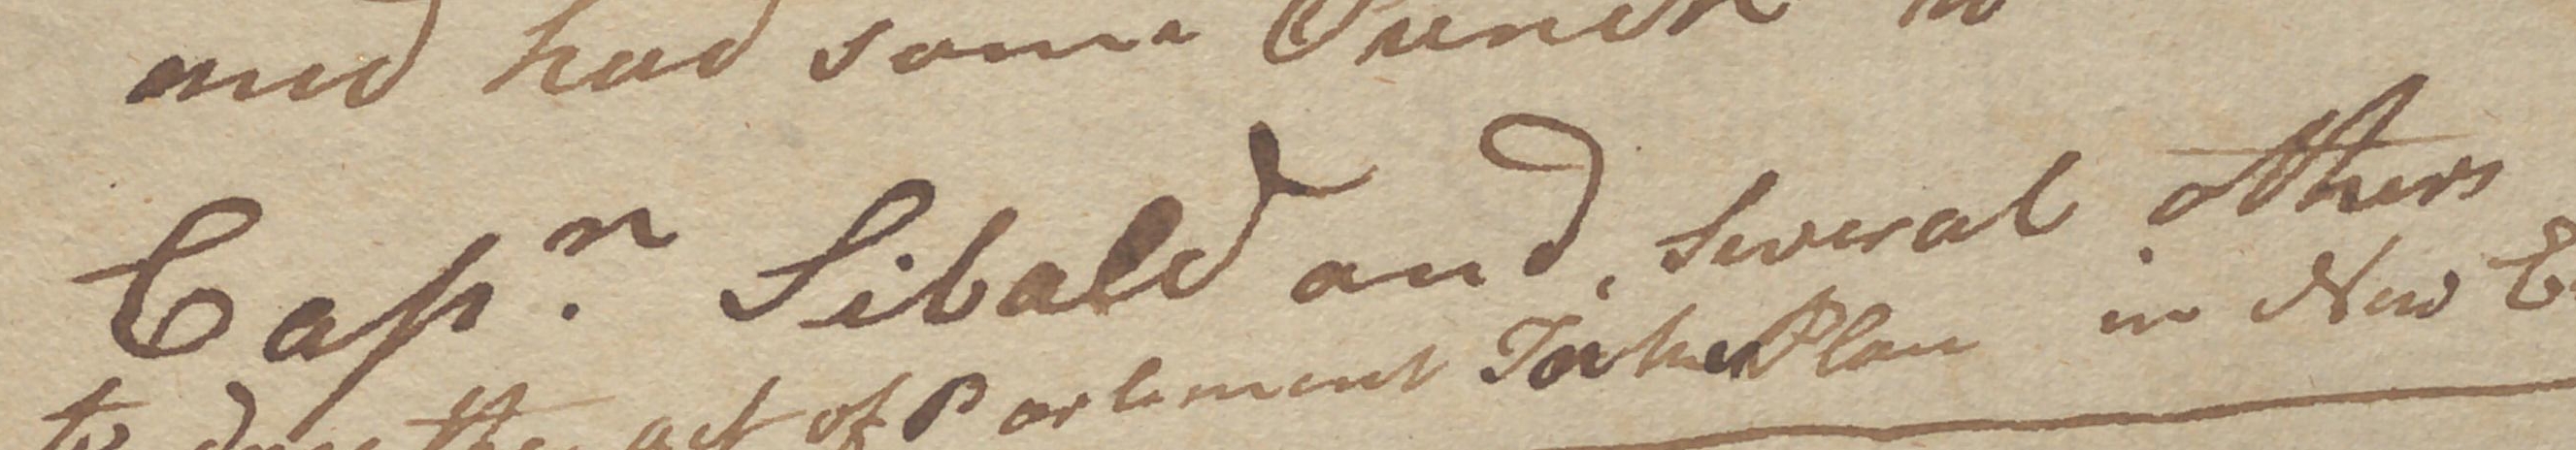Cap^n. Sibald and, several others
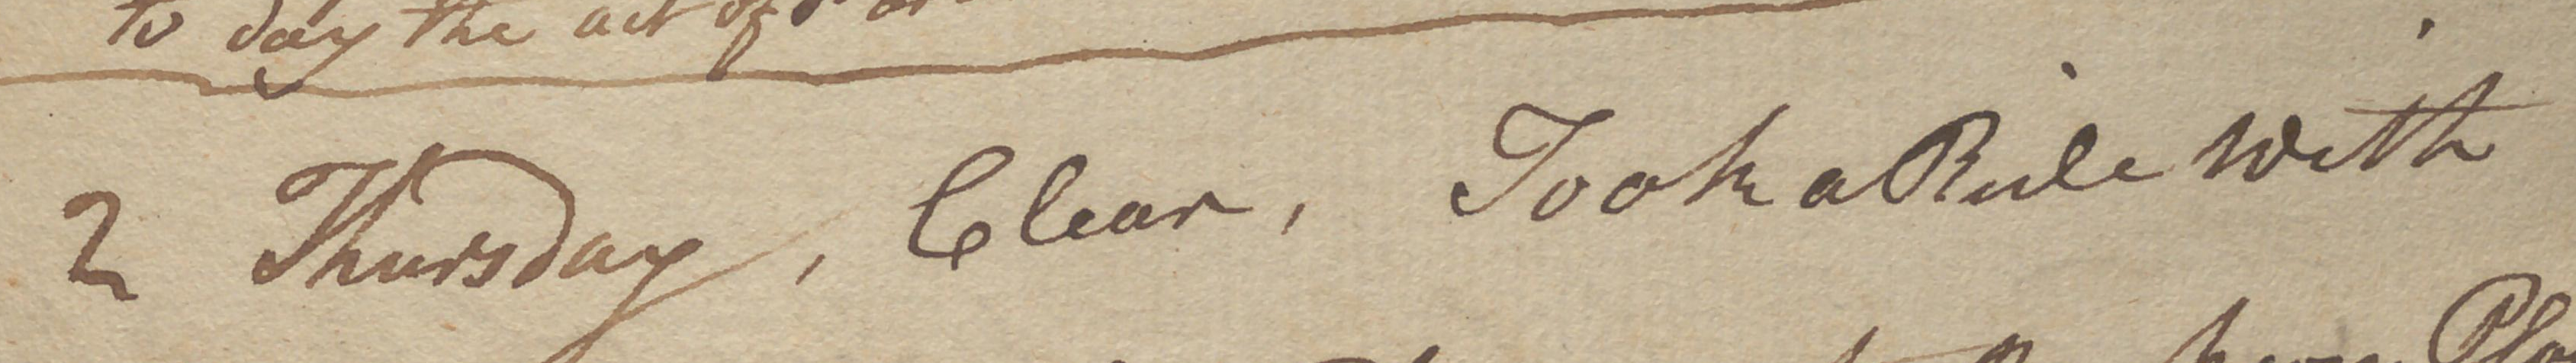2 Thursday, Clear, Took a Ride with
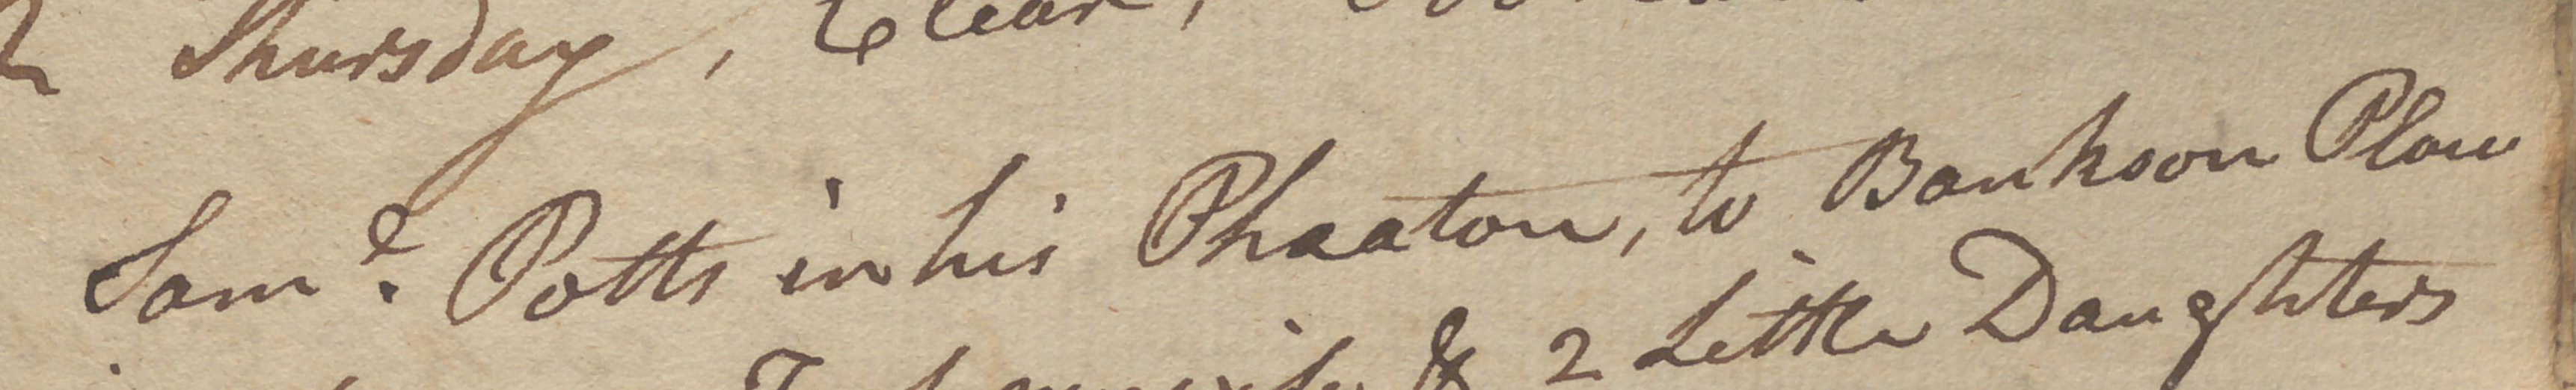Sam^l. Potts in his Pheaton, to Bankson Place
